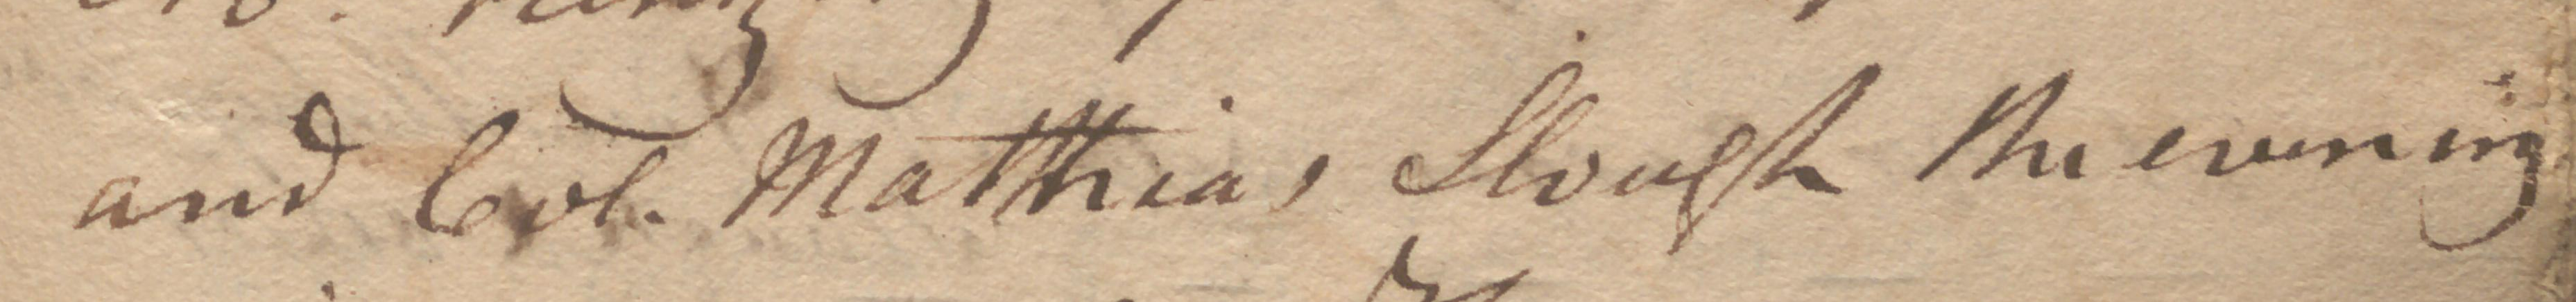and Col. Matthias Slough the evening
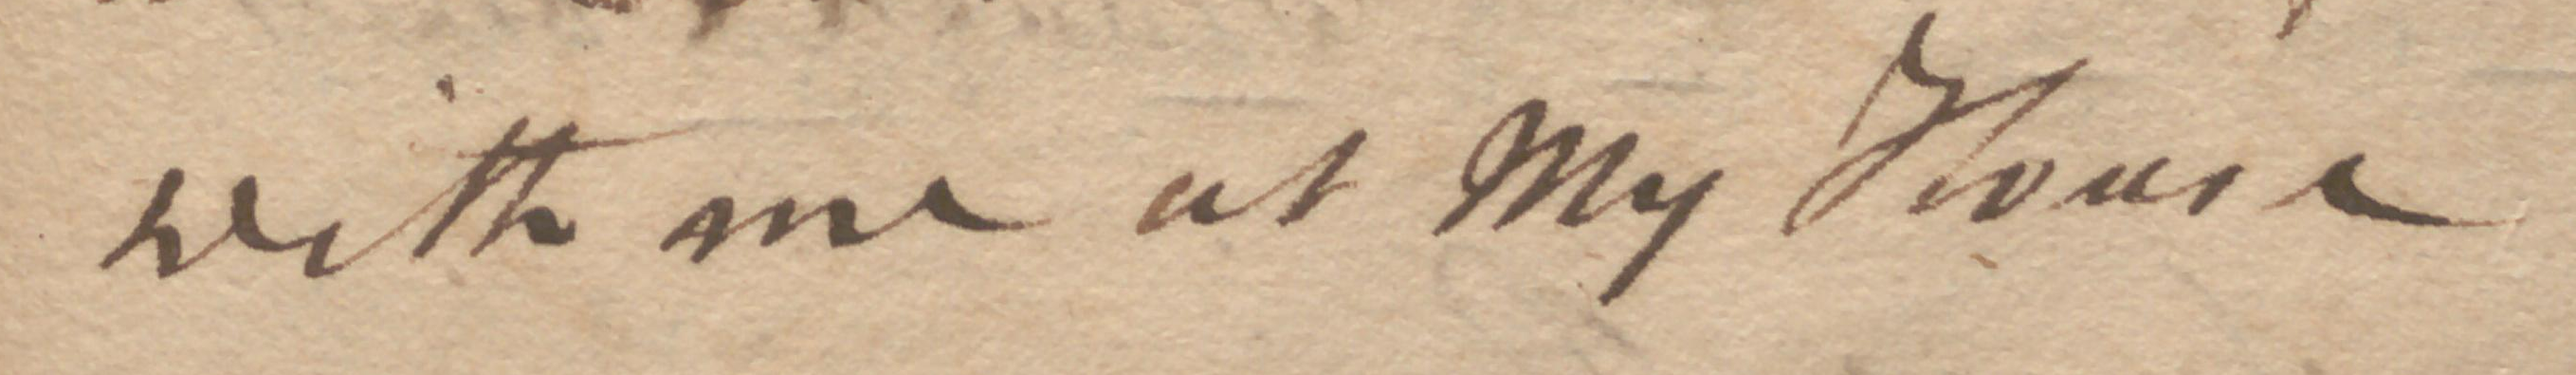with me at My House
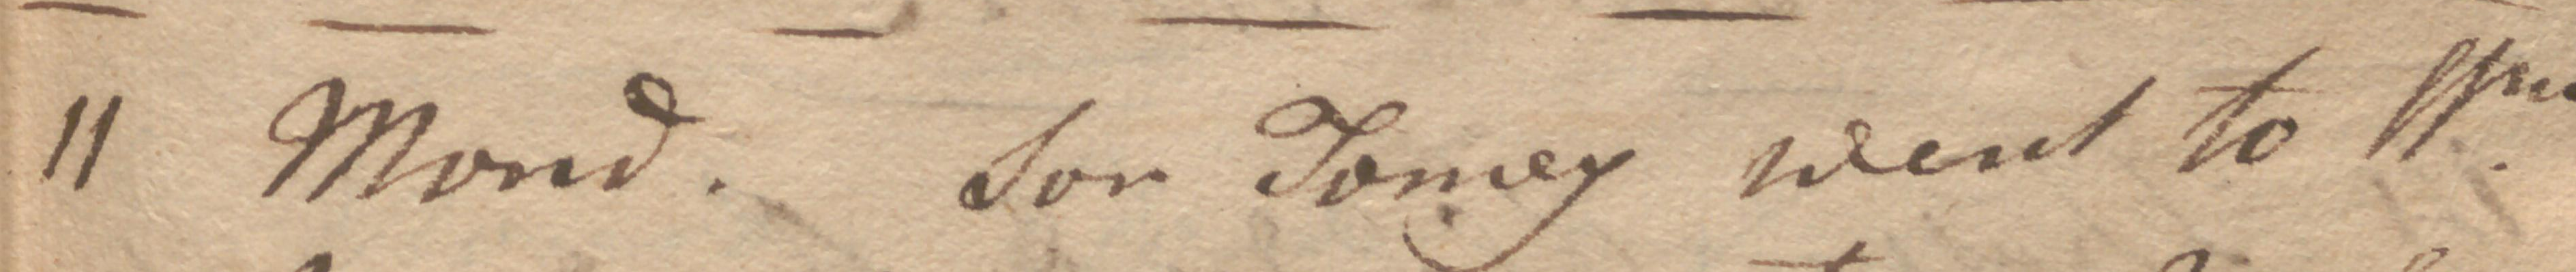11 Mond. Son Tomey went to W^m.
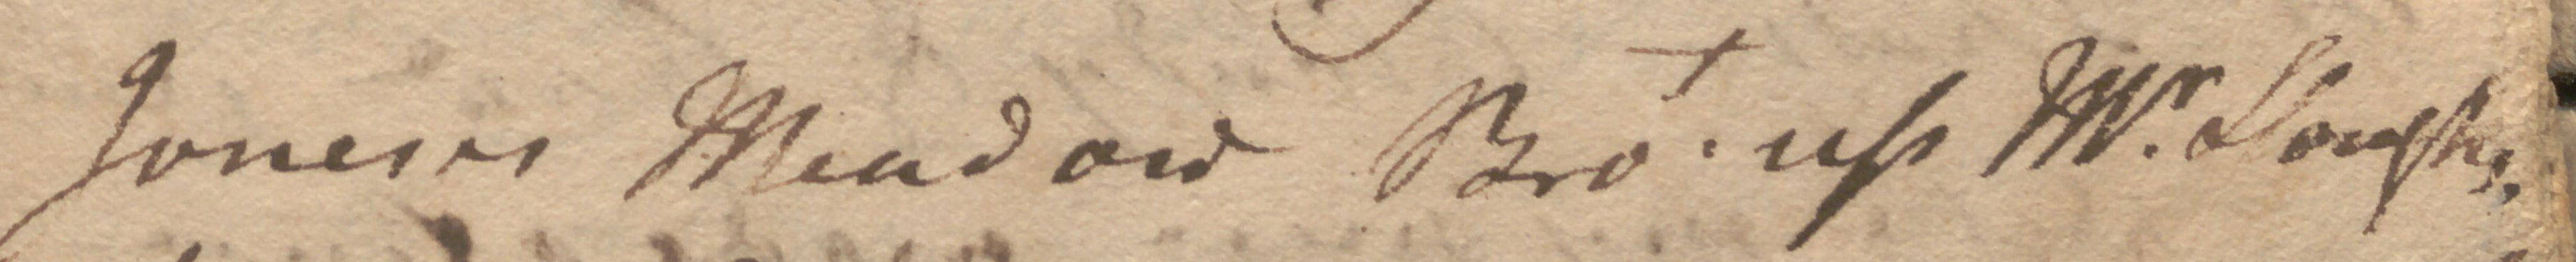Joneses Meadow Bro^t. up M^r. Sloughs
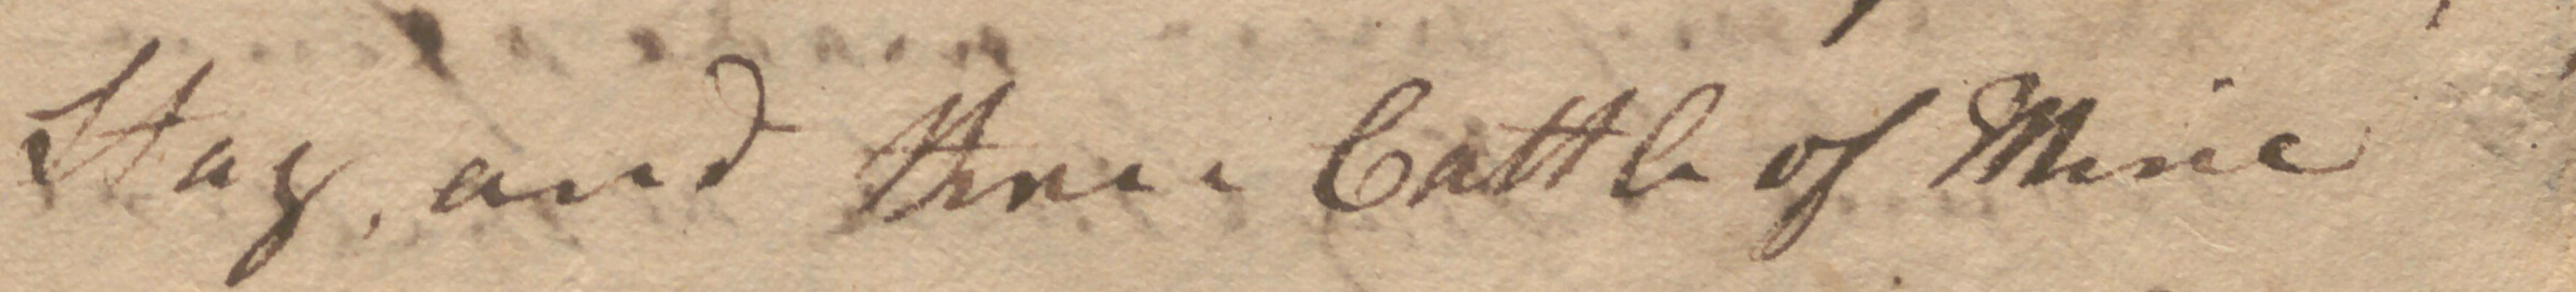Hay, and three Cattle of Mine
